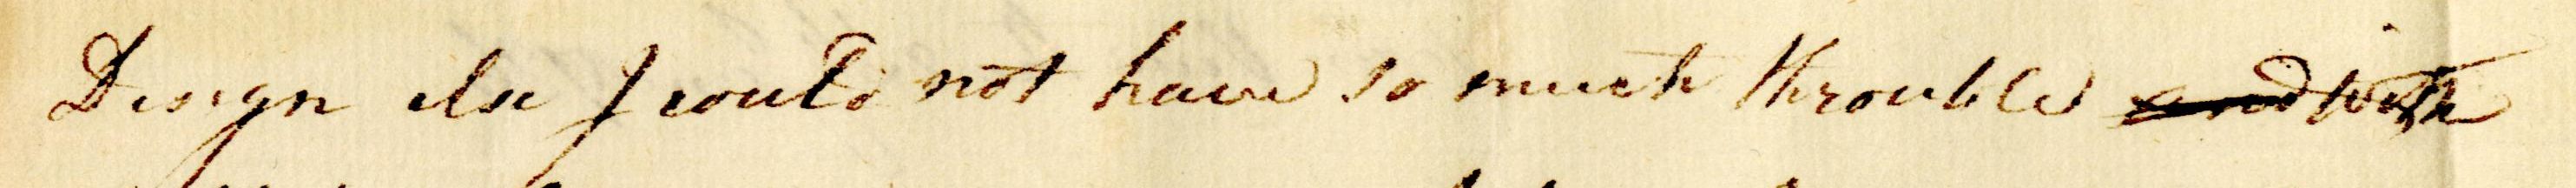Design also I I could not have so much trouble [___] with
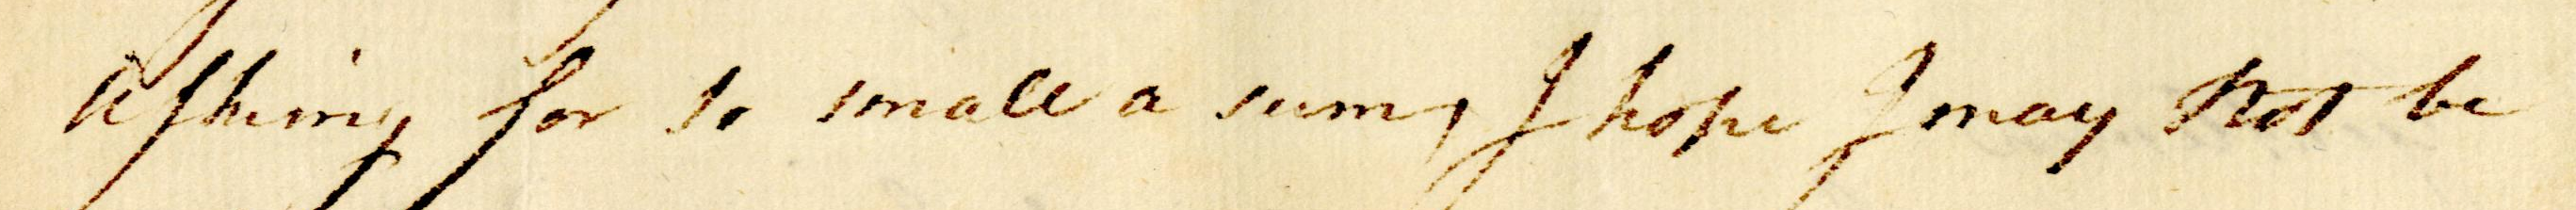asking for so small a sum I hope I may not be
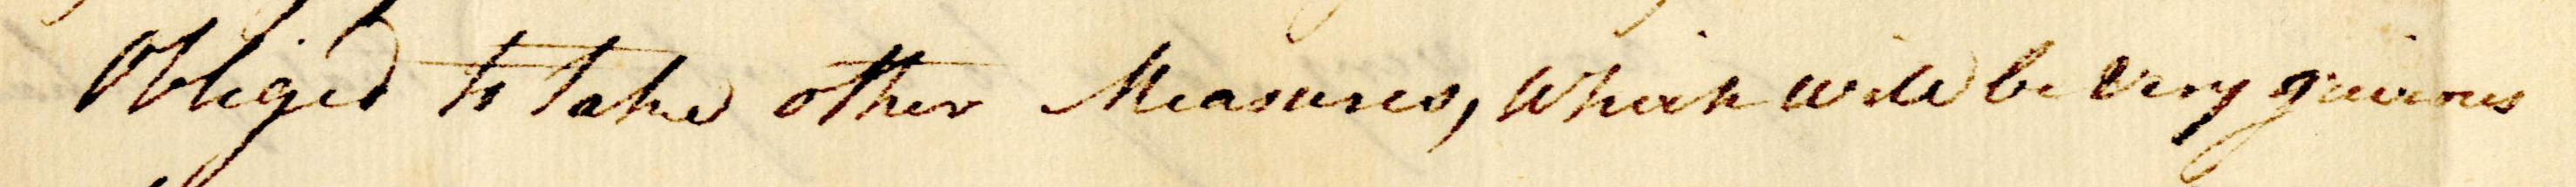Obliged to take other Measures, which will be very grievous
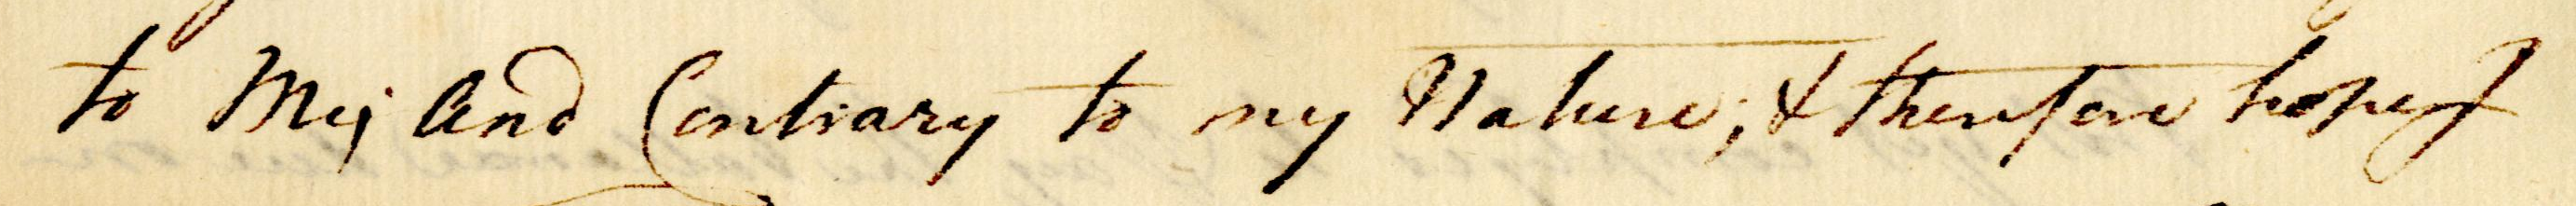to My and Contrary to my Nature, & therefore hope I
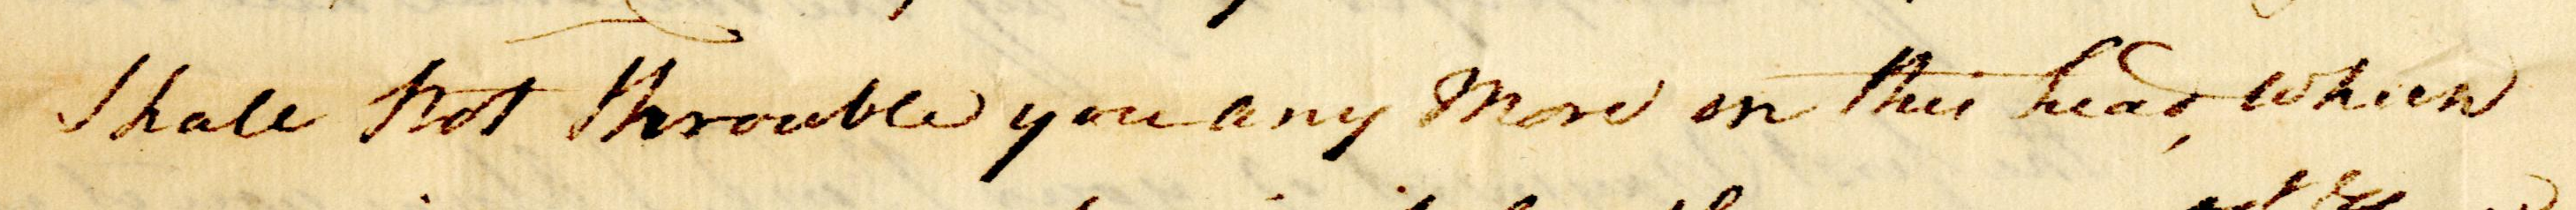Shall not throuble you any More in this hear which
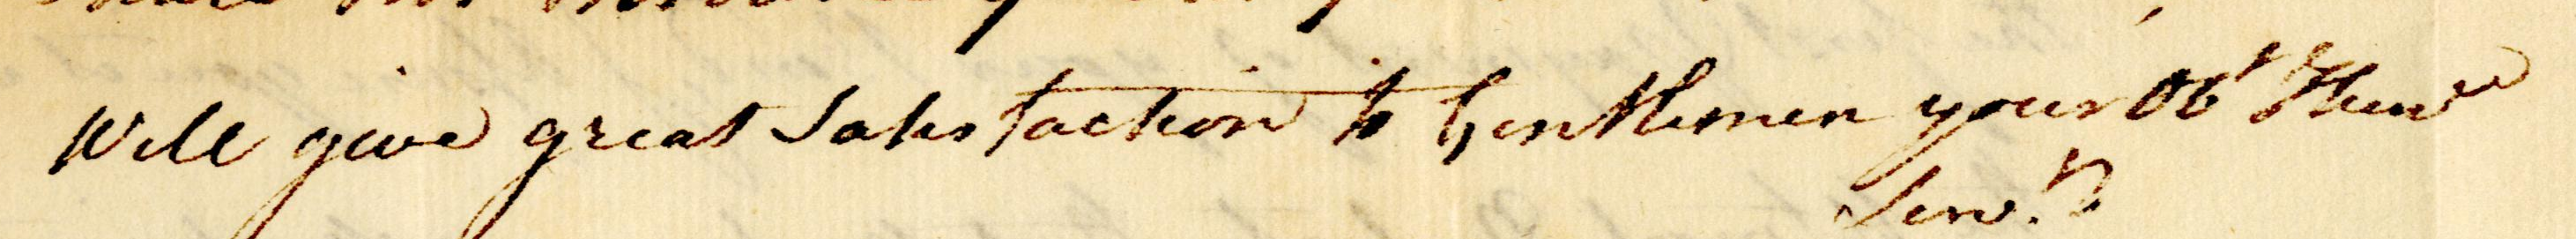Will give great Satisfaction to Gentlemen your ob^t Hum^le
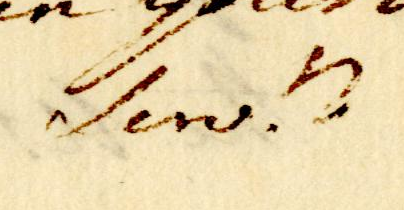serv^t.
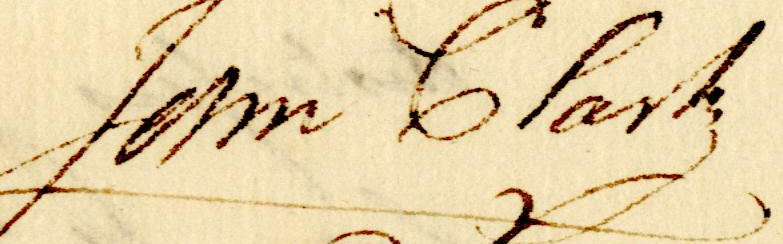John Clark
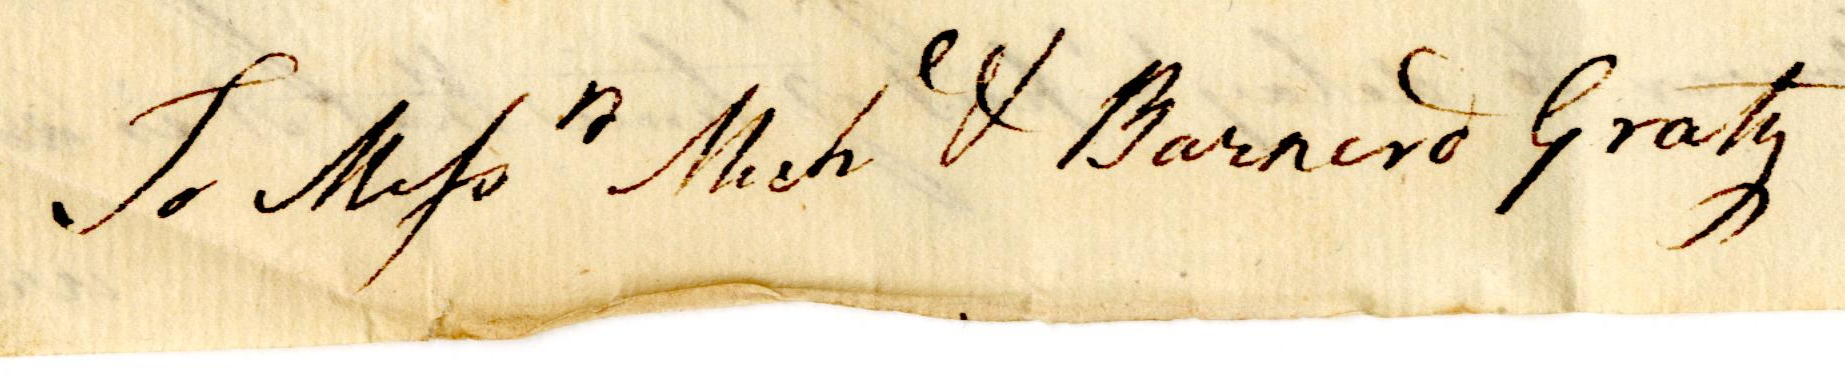To Mess^rs Mich^l & Barnard Gratz
